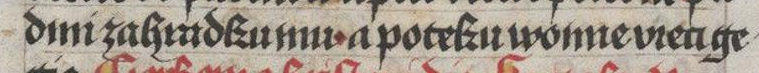dmi zahradku mu.a poteku wonne vieci ge¬
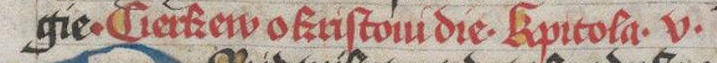gie.Cierkew o kriſtoui die.Kpitola.V.
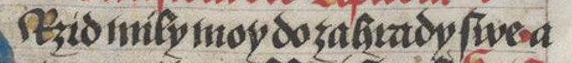Rzid mily moy do zahrady ſwe.a
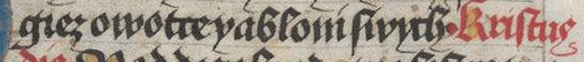giez owotce yabloní ſwych.Kriſtus
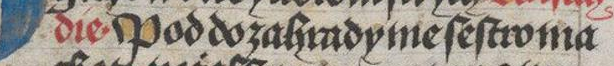die.Pod do zahrady me ſeſtro ma
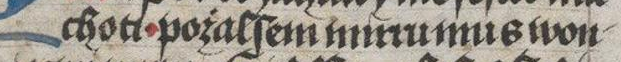choti.pożalſem mirru mu s won¬
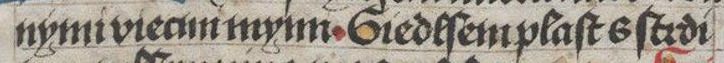nými viecmi mymi.Giedlſem plaſt s ſtrdí¬
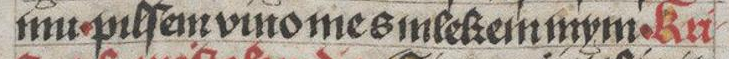mu.pilſem víno me smlekem mym.Kri¬
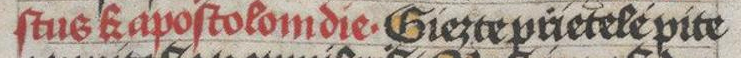ſtus k apoẛtolom die.Gíezte pṙíetelé píte
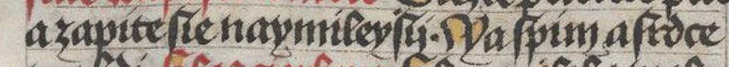a zapíte ſie naymíleyẛíj.Ya ſpím a ſrdce
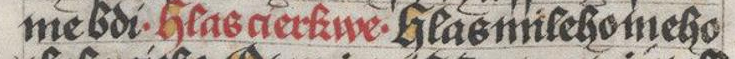me bdí.Hlas cíerkwe.Hlas mileho meho
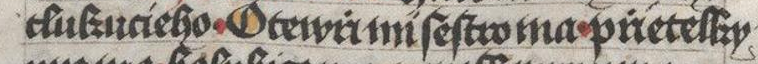tlukucíeho.Otewṙi mi ſeſtro ma.pṙíetelky¬
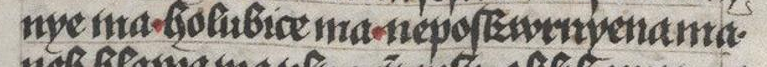nye ma.holubice ma.nepoſkwrnyena ma.
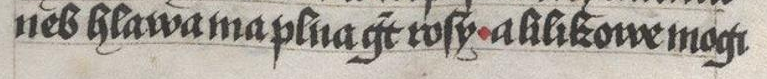neb hlawa ma plna ḡt roſy.a lilikowe mogi
